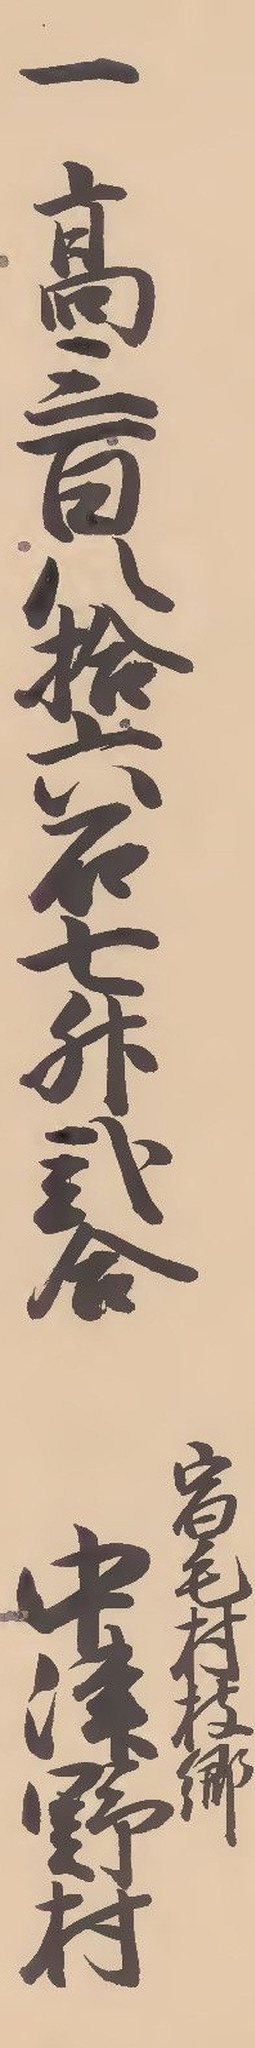一髙三百八拾六石七升弐合中津野村

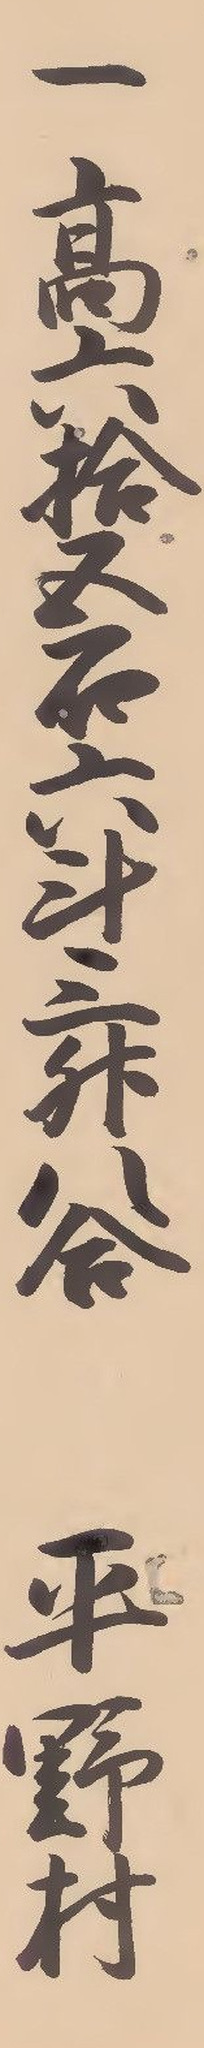一髙六拾五石六斗三升八合平野村
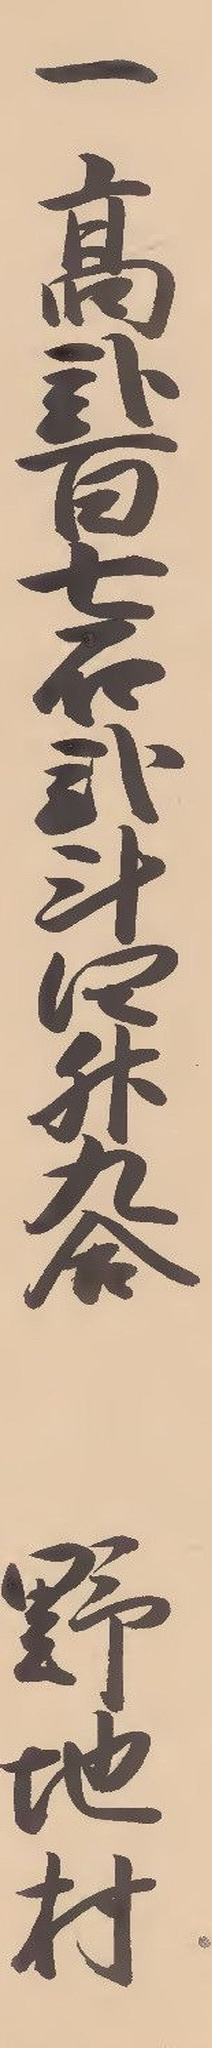一髙弐百七石弐斗四升九合野地村
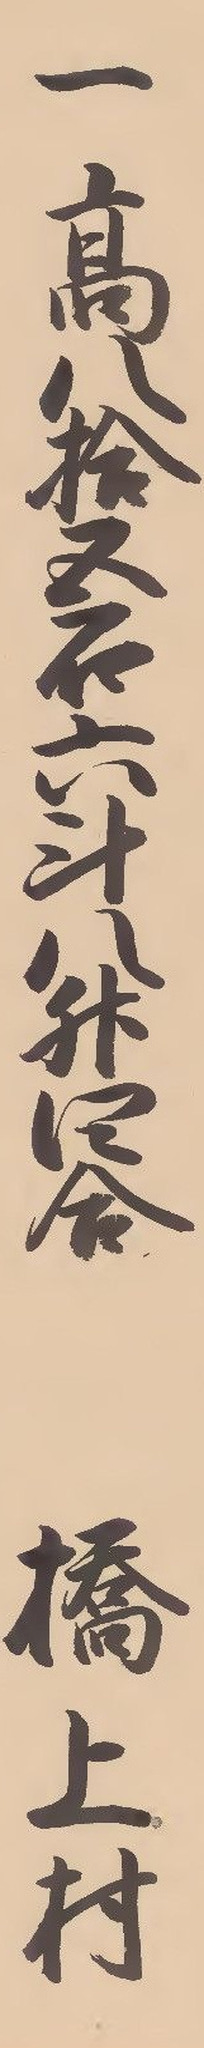一髙八拾五石六斗八升四合橋上村
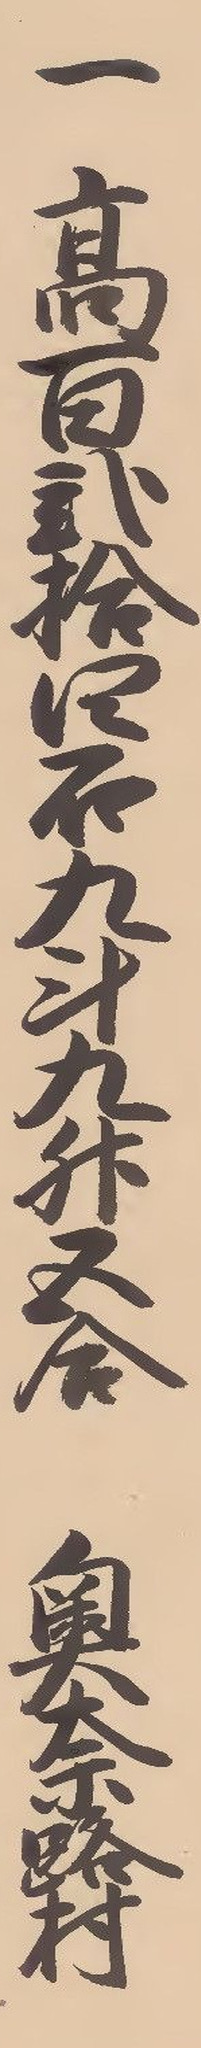一髙百弐拾四石九斗九升五合奥奈路村
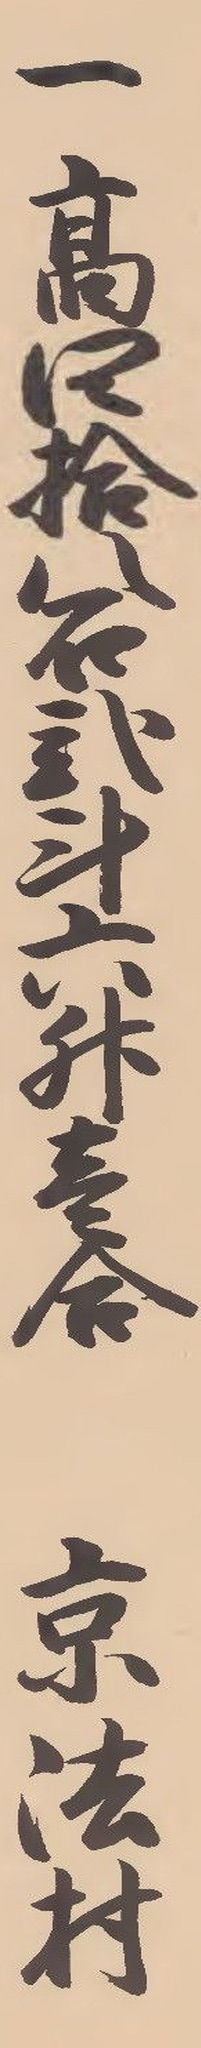一髙四拾八石弐斗六升壱合京法村
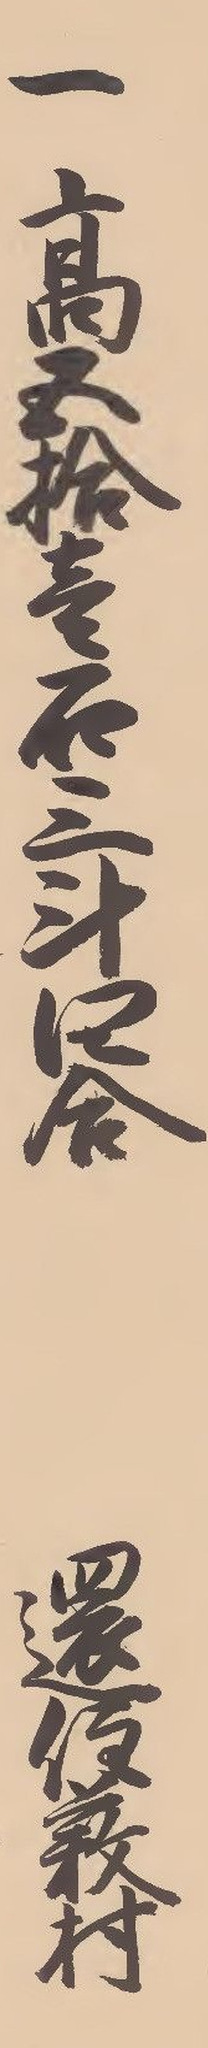一髙五拾壱石三斗四合還住藪村
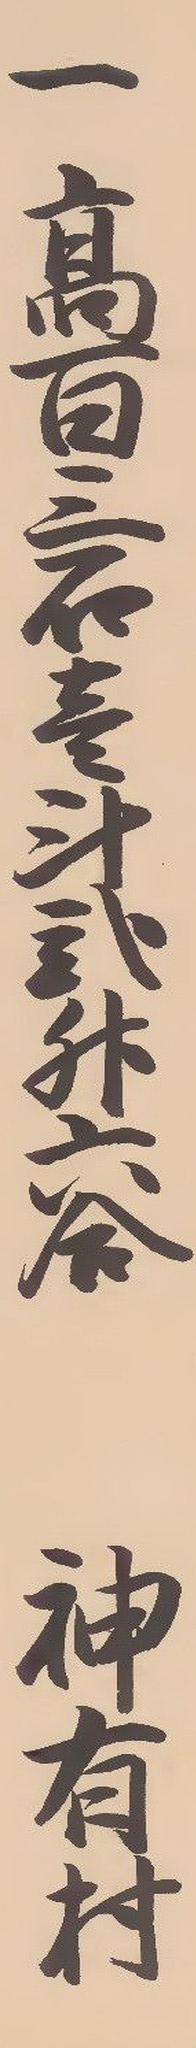一髙百三石壱斗弐升六合神有村
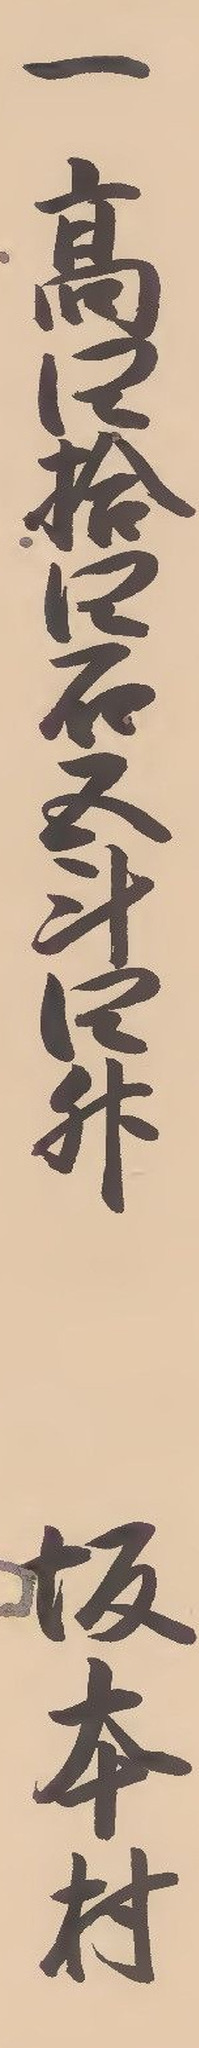一髙四拾四石五斗四升坂本村

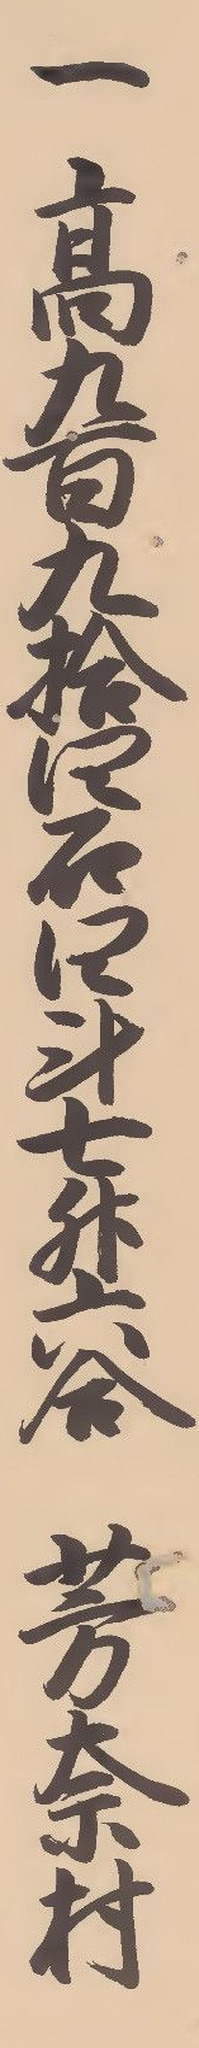一髙九百九拾四石四斗七升六合芳奈村
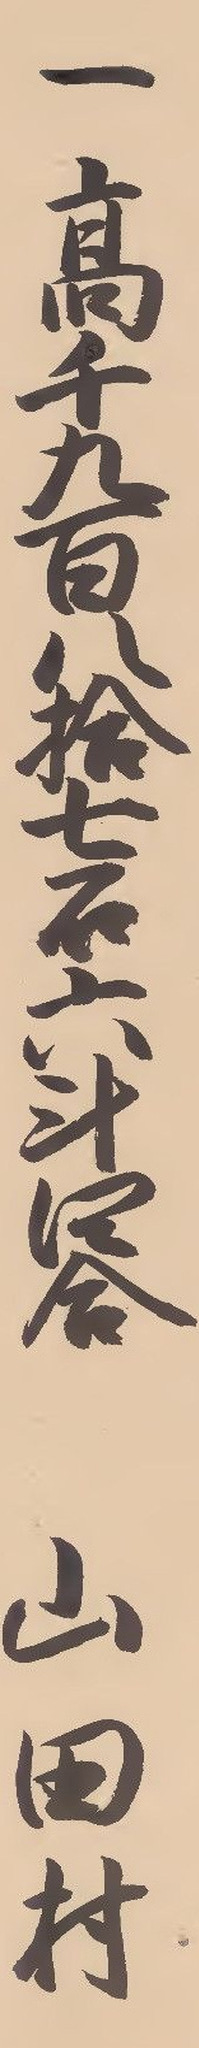一髙千九百八拾七石六斗四合山田村
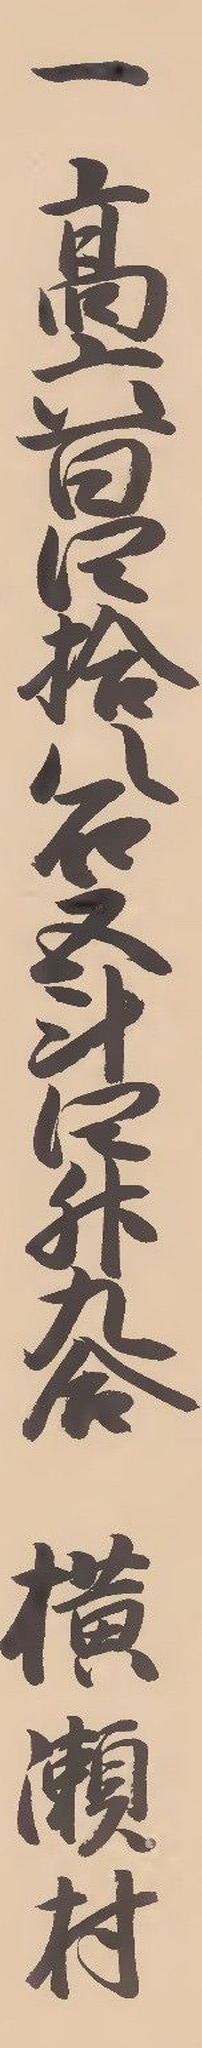一髙六百四拾八石五斗四升九合横瀬村
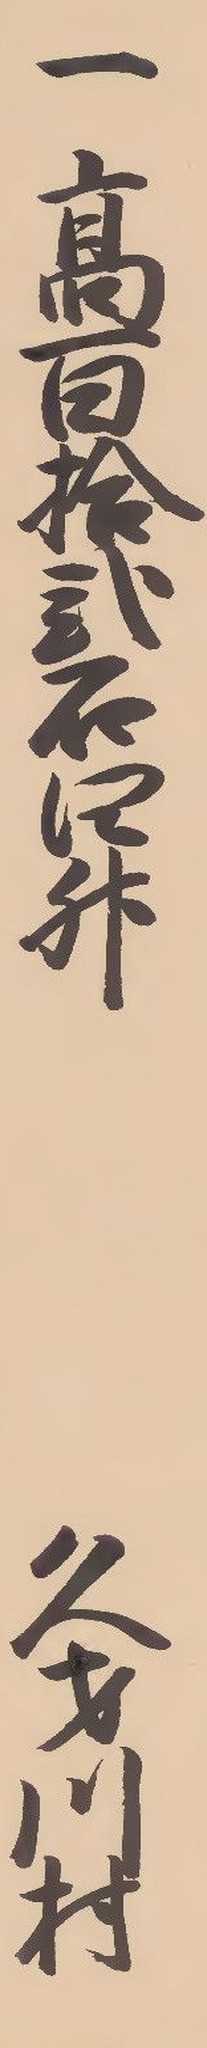一髙百拾弐石四升久才川村
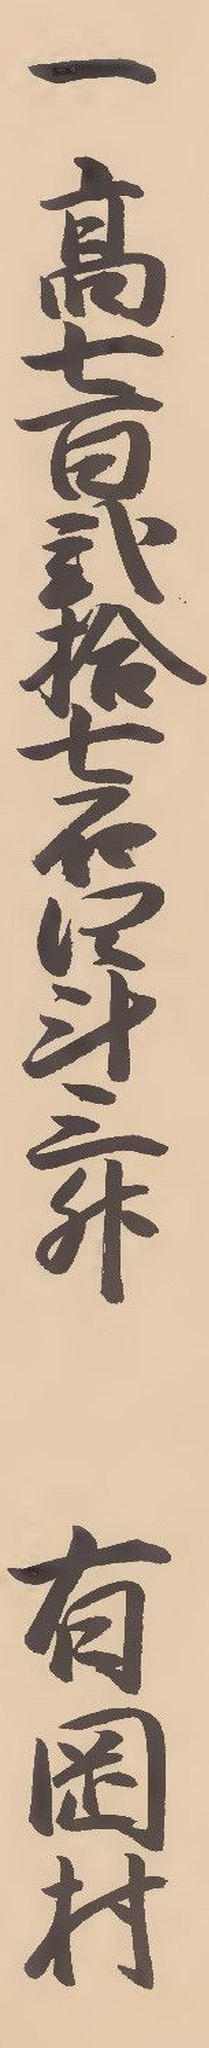一髙七百弐拾七石四斗三升有岡村
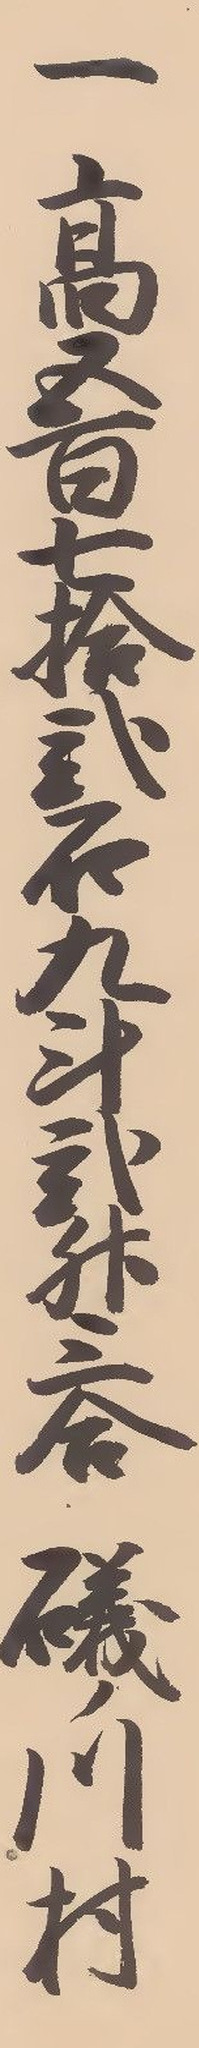一髙五百七拾弐石九斗弐升三合礒ノ川村
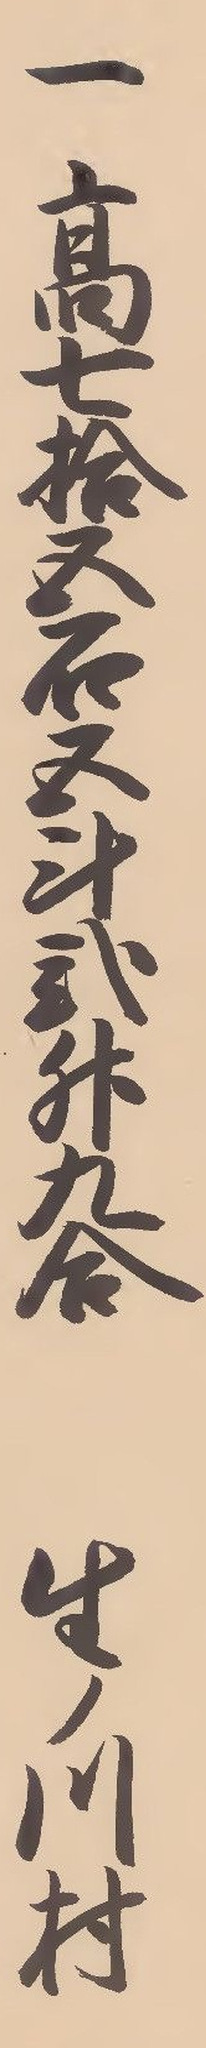一髙七拾五石弐升九合生ノ川村
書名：土佐国郷帳
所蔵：国立公文書館 National Archives of Japan
